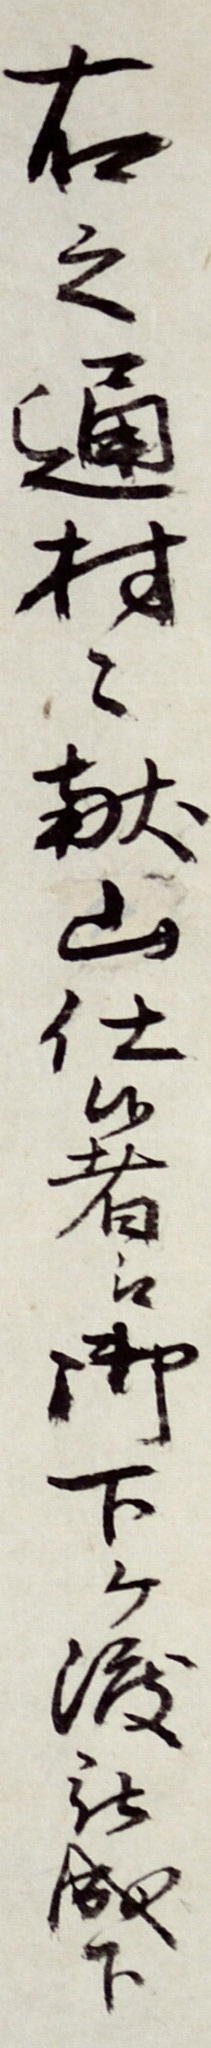右之通村々献山仕候者江御下ケ渡被成下
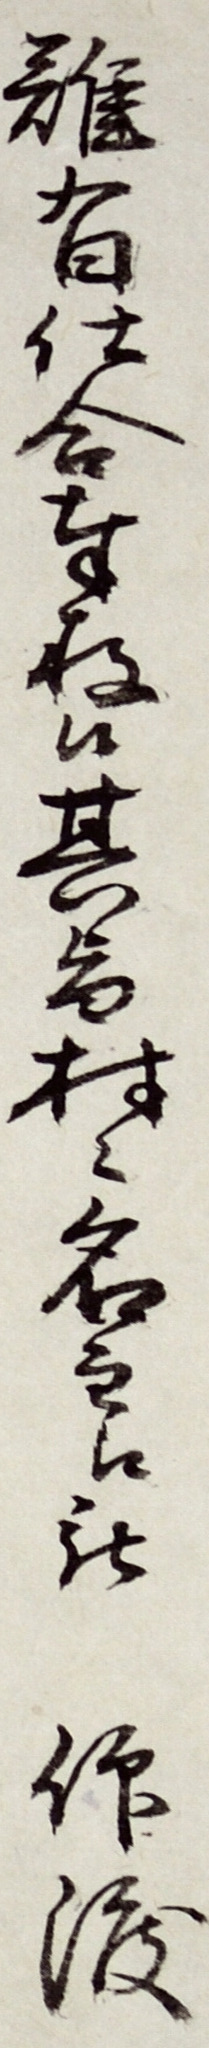難有仕合奉存候其旨村々名主江被仰渡
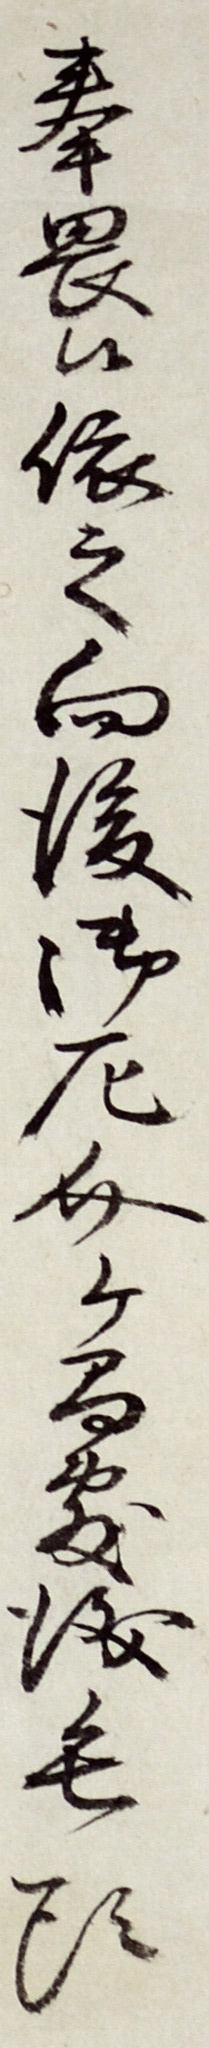奉畏候依之向後御厄介ケ間敷儀毛頭
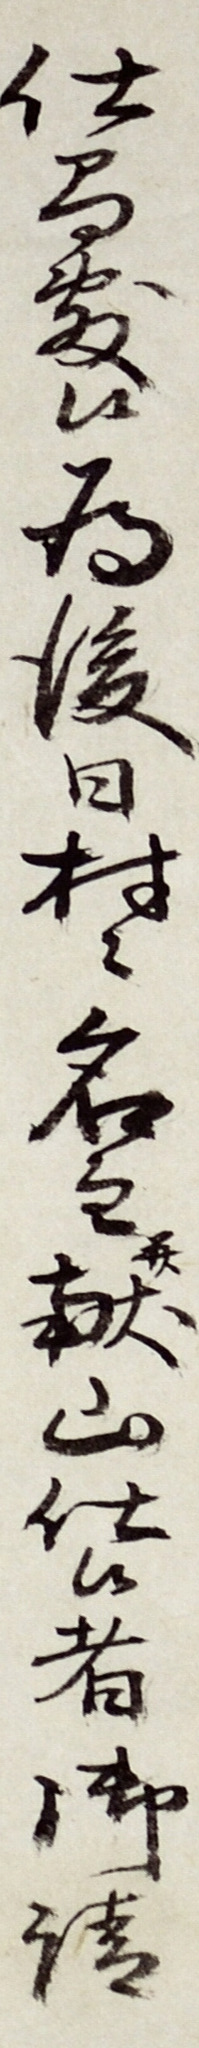仕間敷候為後日村々名主并献山仕候者御請
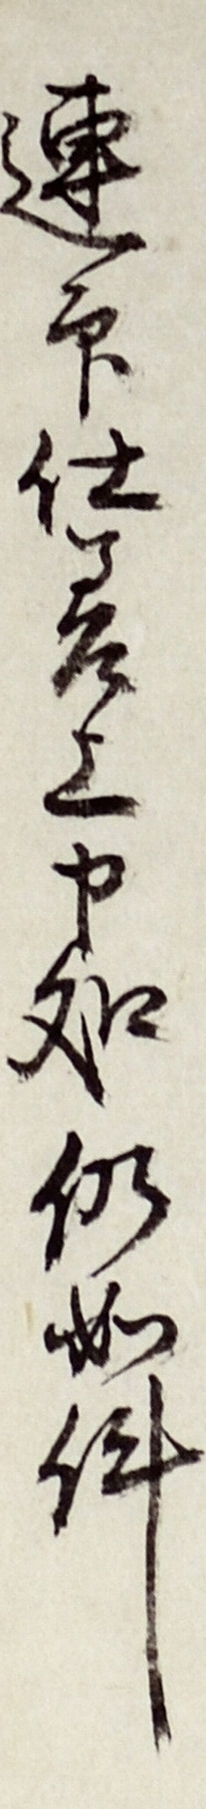連印仕差上申処仍如件
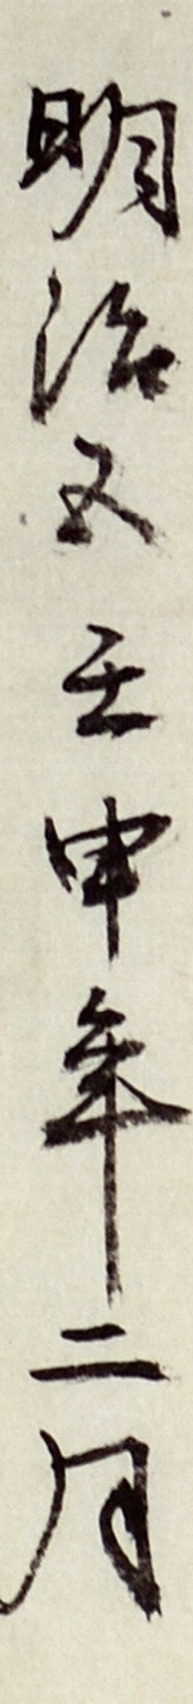明治五壬申年二月
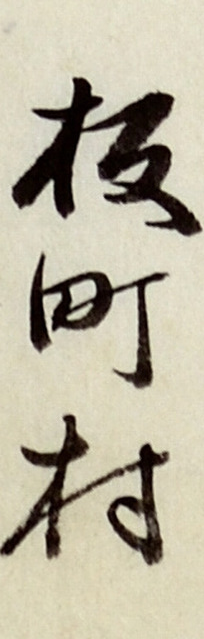板町村
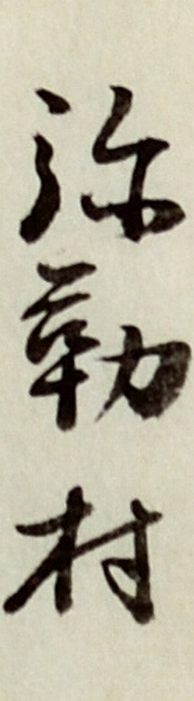弥勒村

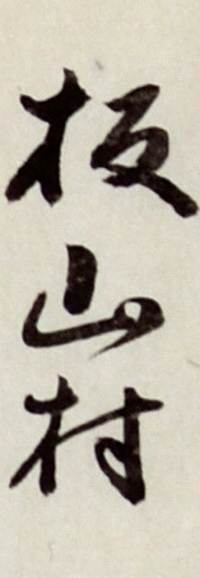板山村
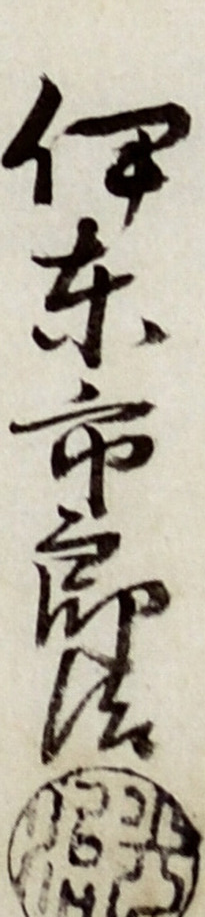伊東市郎治㊞
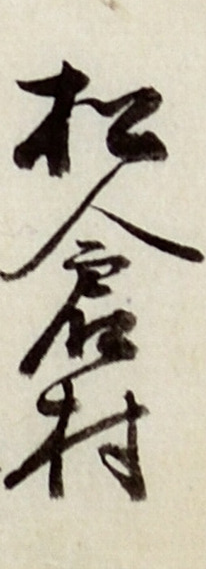松倉村
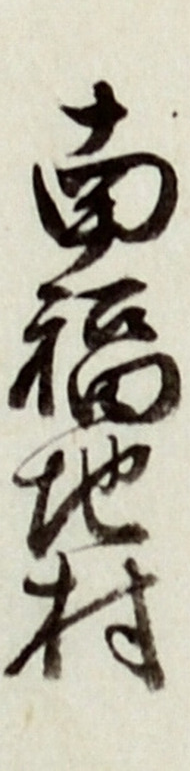南福地村

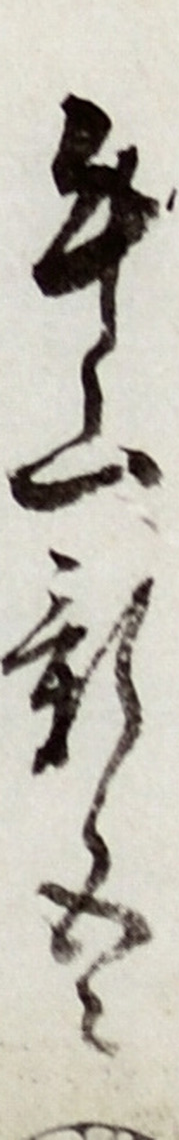牛山新吾㊞
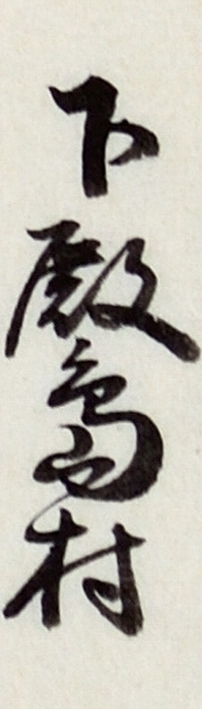下殿島村
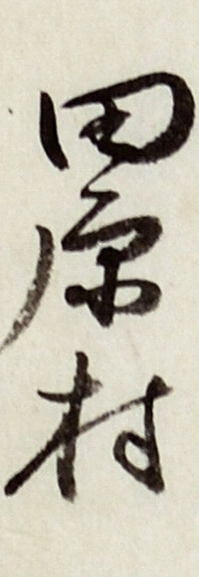田原村
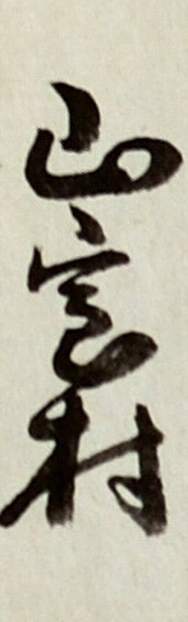山室村
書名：御林御下ケ渡御請印帳
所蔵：伊那市立高遠町図書館・合同会社AMANE
